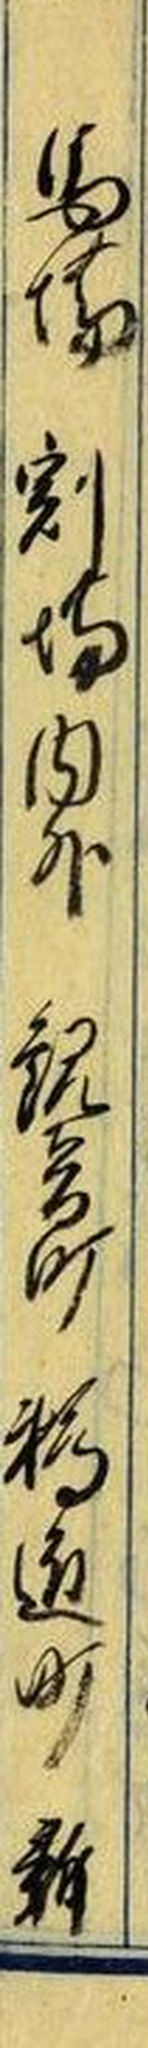馬場割場内外観音町鵜匠町新
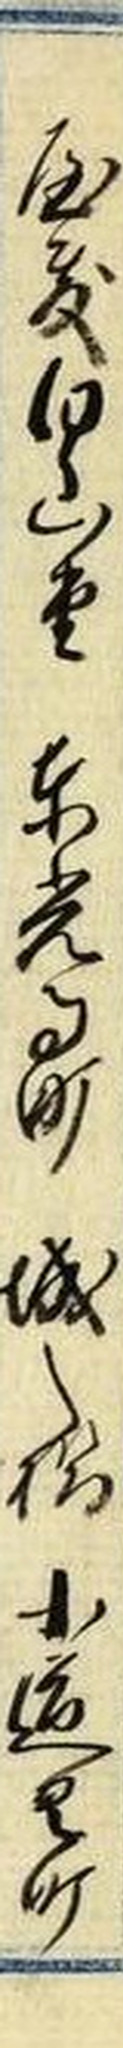屋敷白山堂東光寺町城之橋小道具町
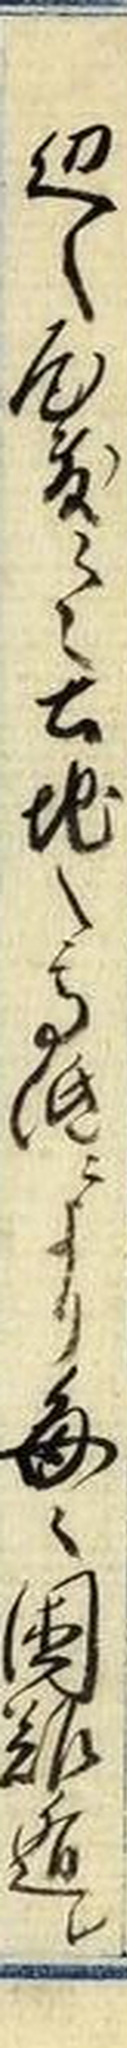辺之屋敷々々土地之高低ニより毎々困難遁レ
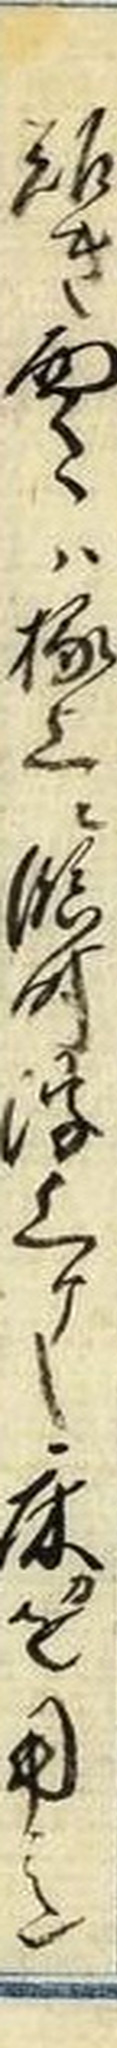難き面々ハ椽上ニ臨時浮上ヶ之床ヵを用意
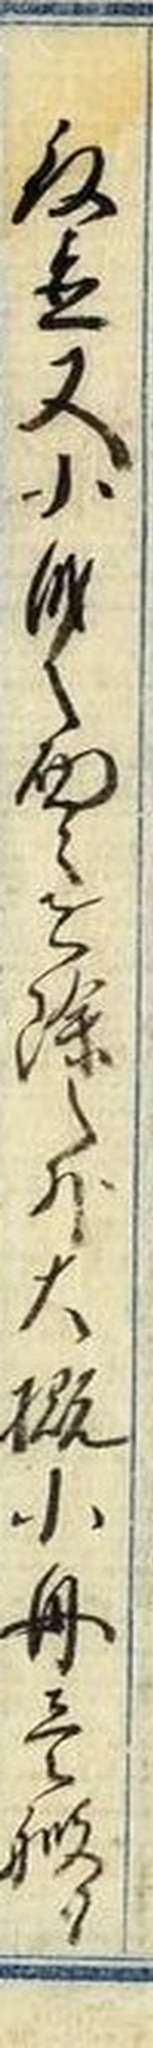致置又小身之面々を除之外大概小舟壱艘も
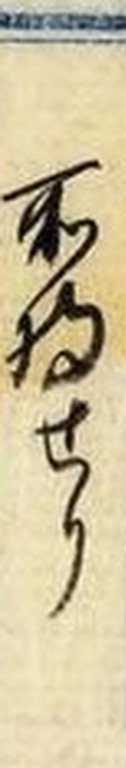所持せり
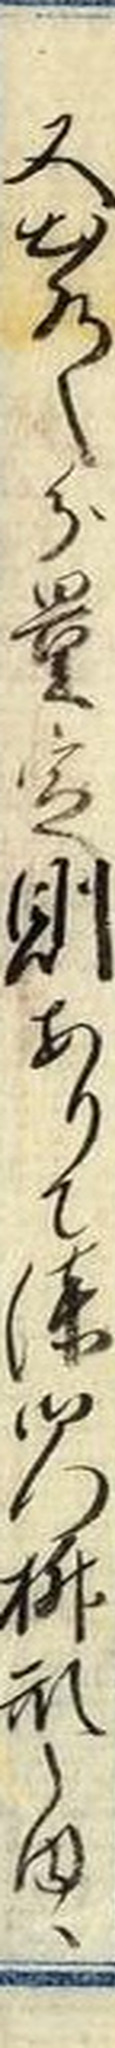又出水之分量定則ありて漆御門桝形之内へ
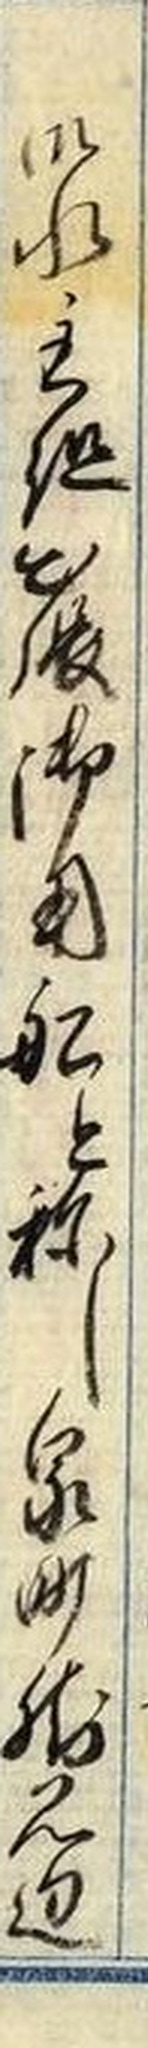御水主組出張御用船と称し泉町勝見辺
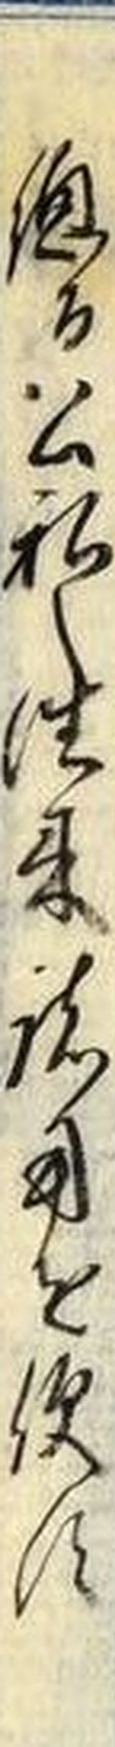総而公私之往来諸用を便す
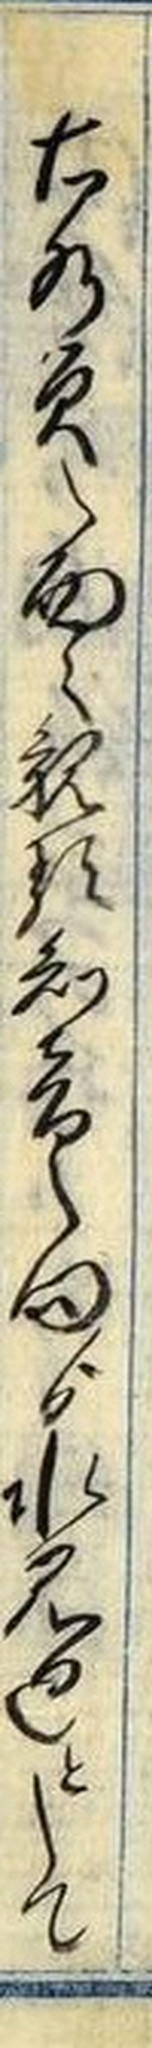右水員災之面々親類知音之向ゟ水見辺廻として

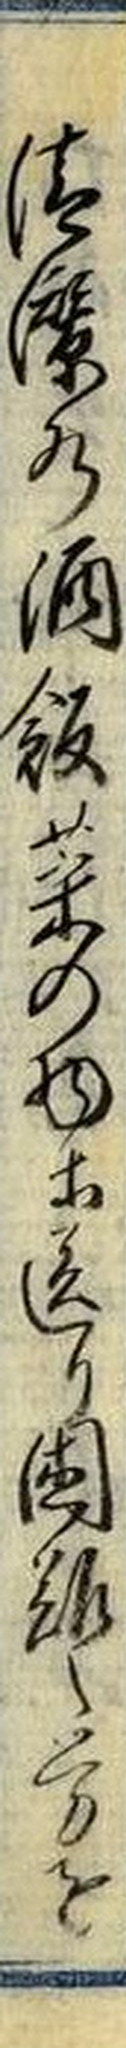清潔水酒飯菜の物等送り困難之労を
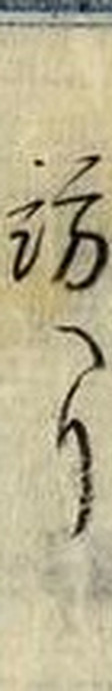訪へり
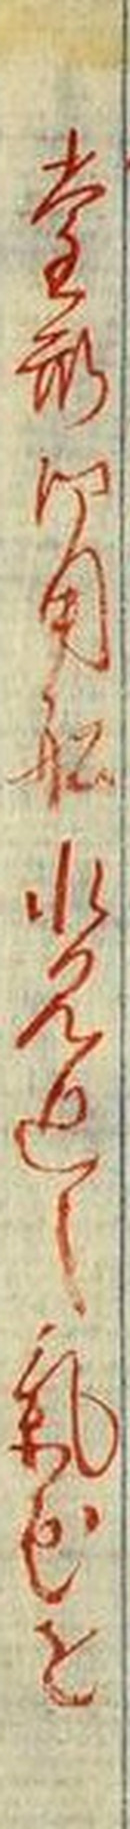堂形御用船水見辺廻之気色を
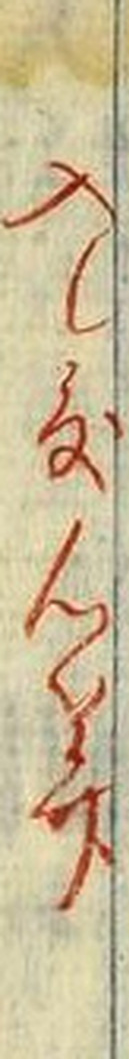入れ度心算

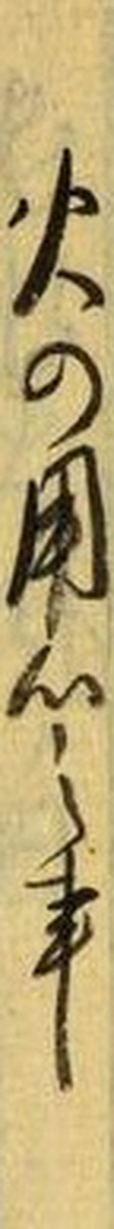火の用心之事
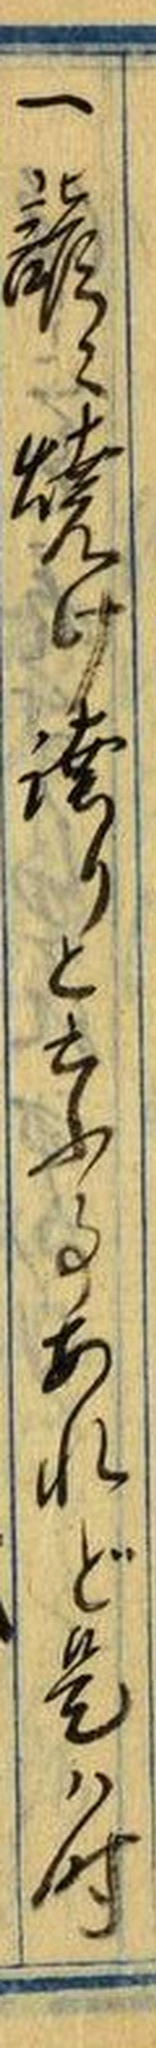一諺に焼け誇りと云ふ事あれども是ハ時
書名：温古集 五巻
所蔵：福井県文書館 Fukui Prefectural Archives
